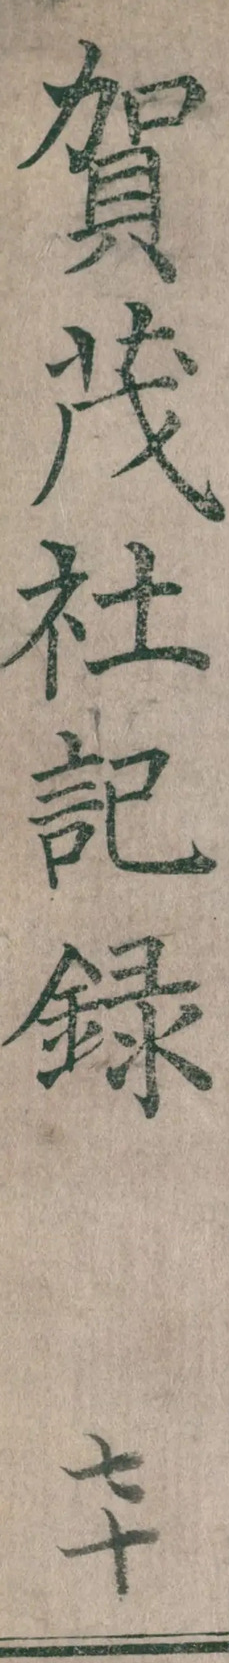賀茂社記録七十

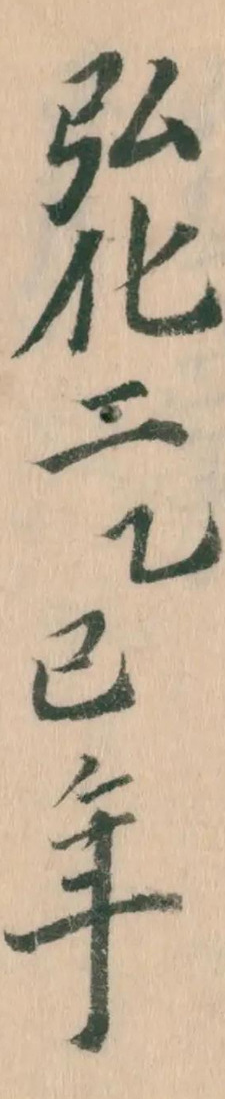弘化二乙巳年
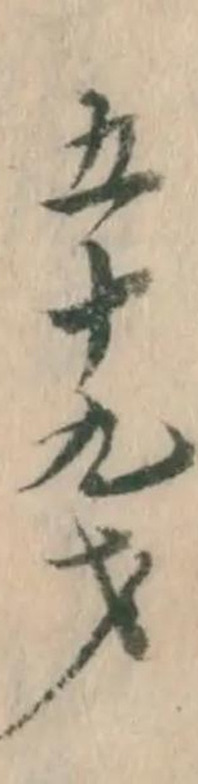五十九才

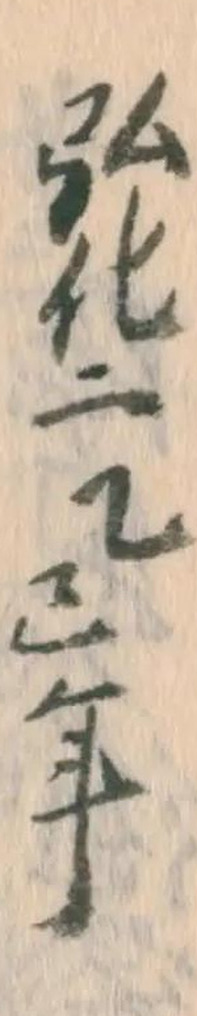弘化二乙巳年
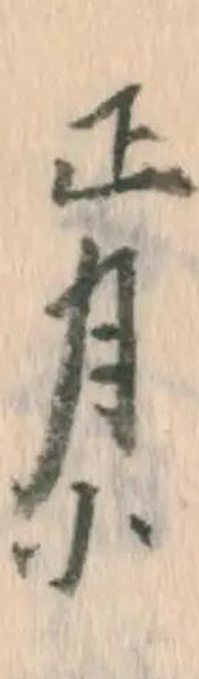正月小
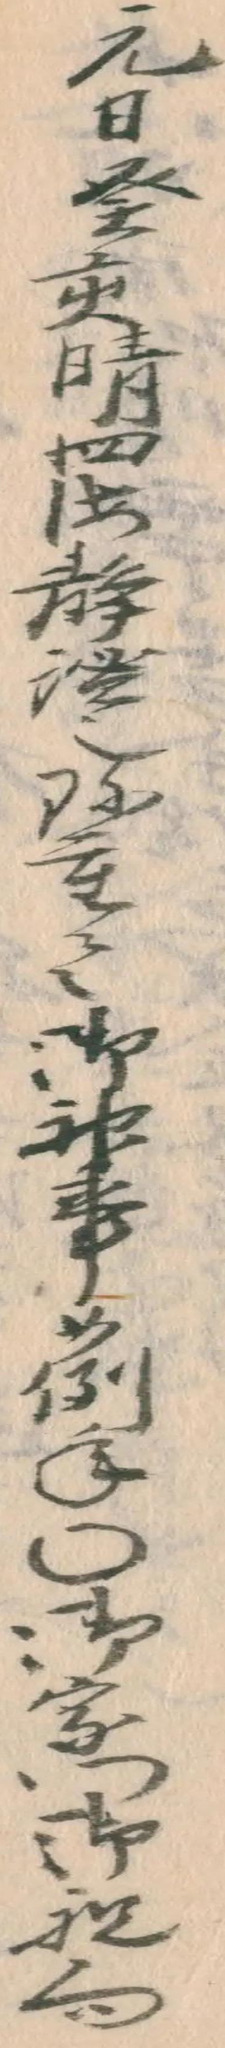元日癸亥晴四海静謐也弥重々々御神事如例年○御家門御祝向
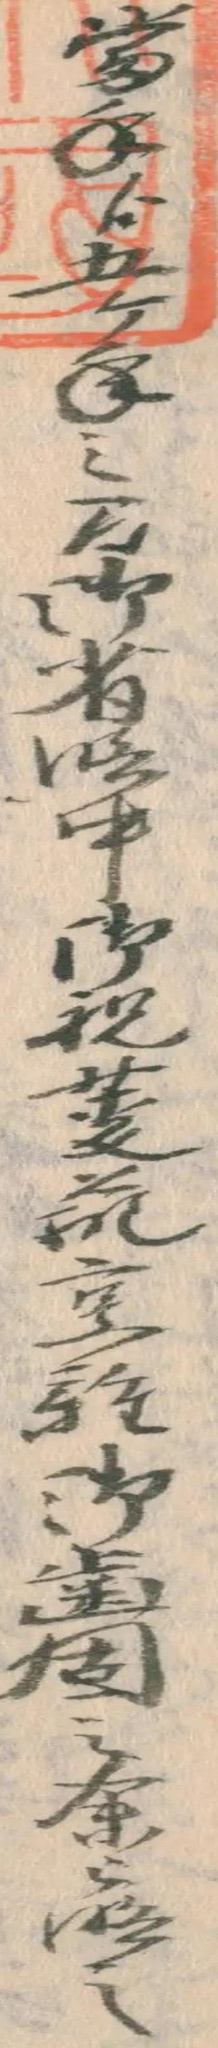當年ゟ五ヶ年之間御省略中御祝菱葩重御歯固之余被略之
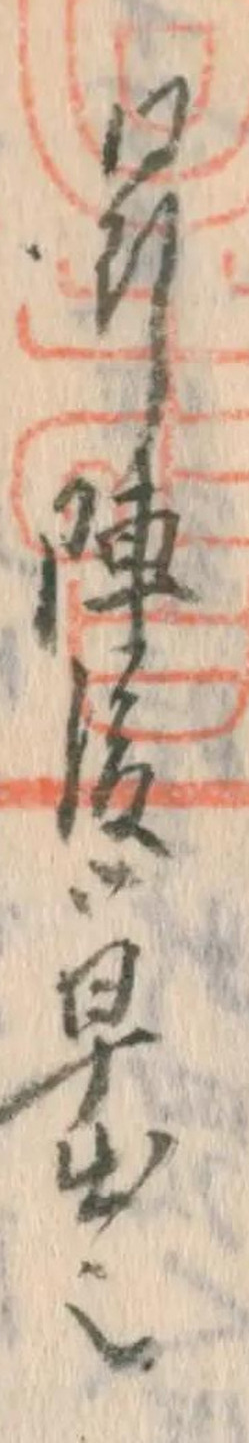同断陣後御早出也
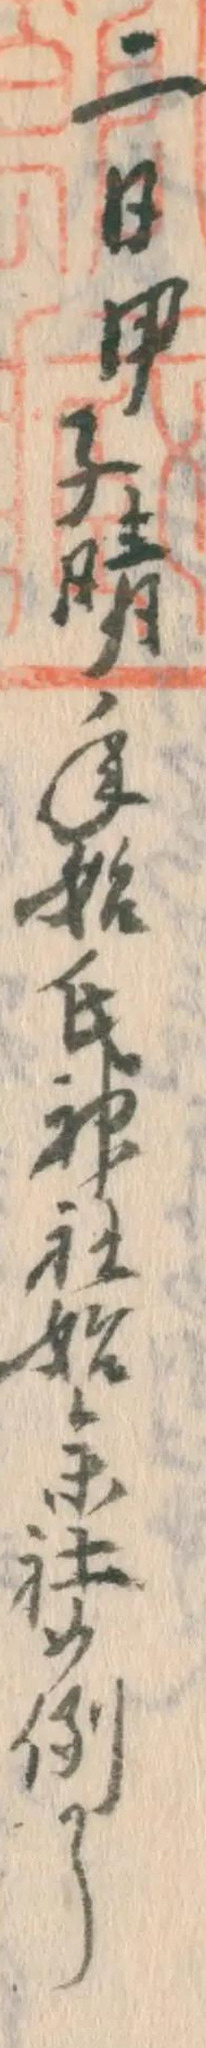二日甲子晴年始氏神社始参社如例了
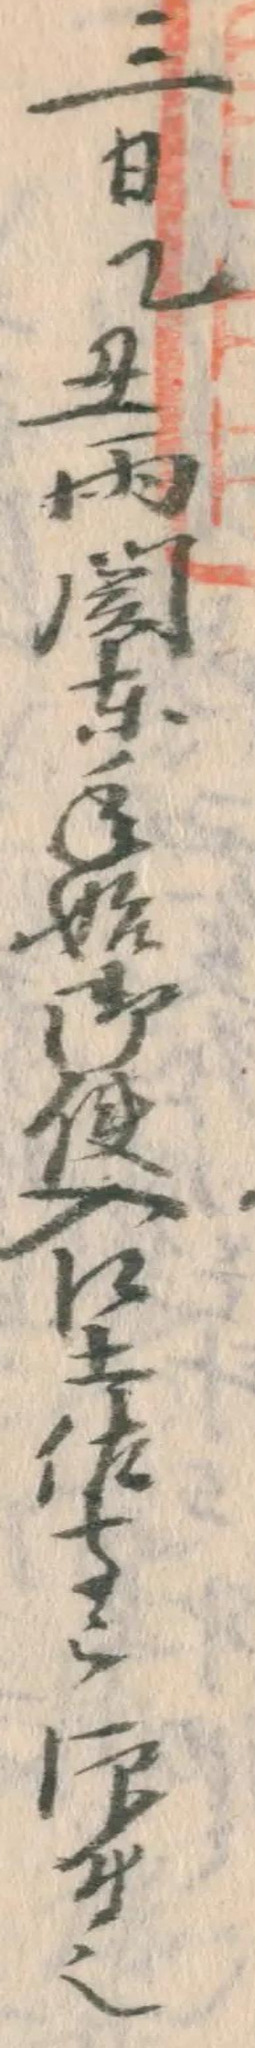三日乙丑雨関東年始御使入江土佐守被仰付也
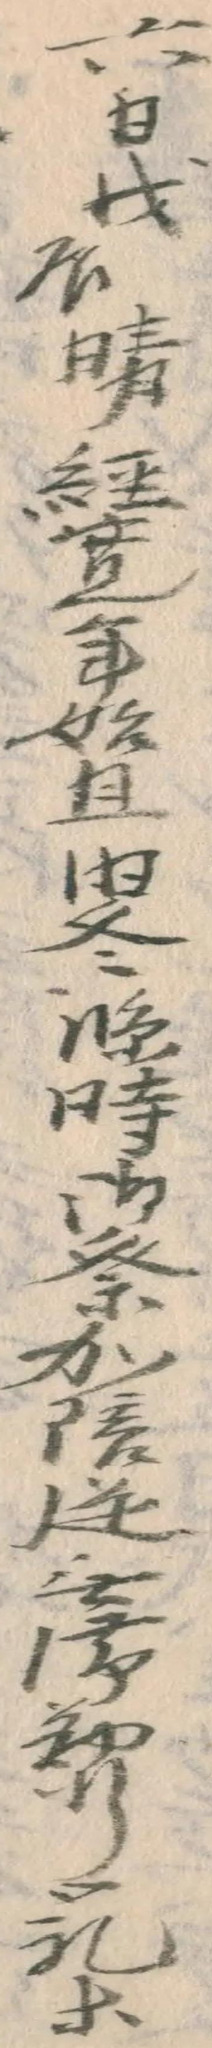六日戊辰晴経寛年始且明冬臨時御祭加陪従無滞勤行御礼等
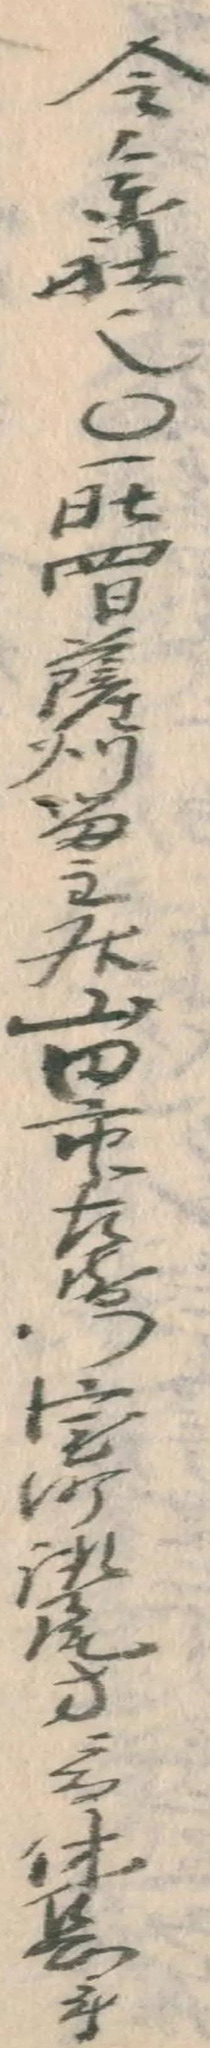令参社也○一昨四日薩州留主居山田市左衛門室町瀬尾方ニ而休息ニ付
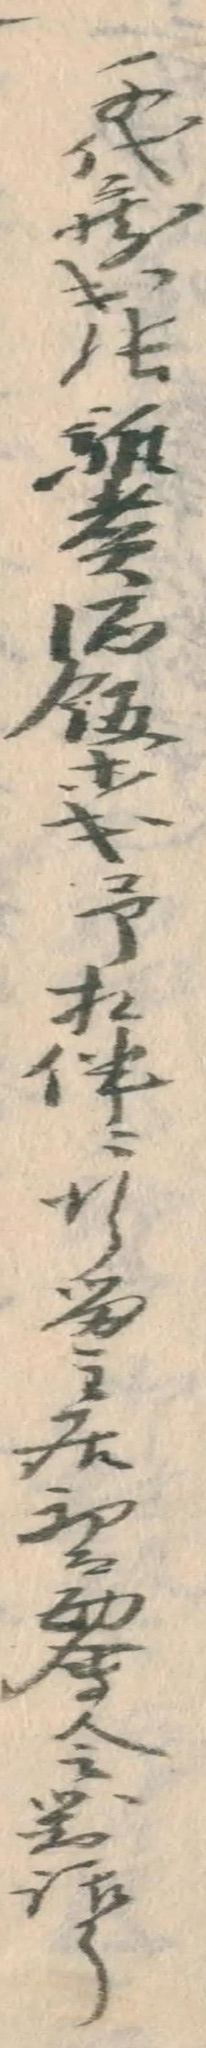千代蔵出張雑煮酒飯等出予相伴ニ行留主居初而面會令對詰了
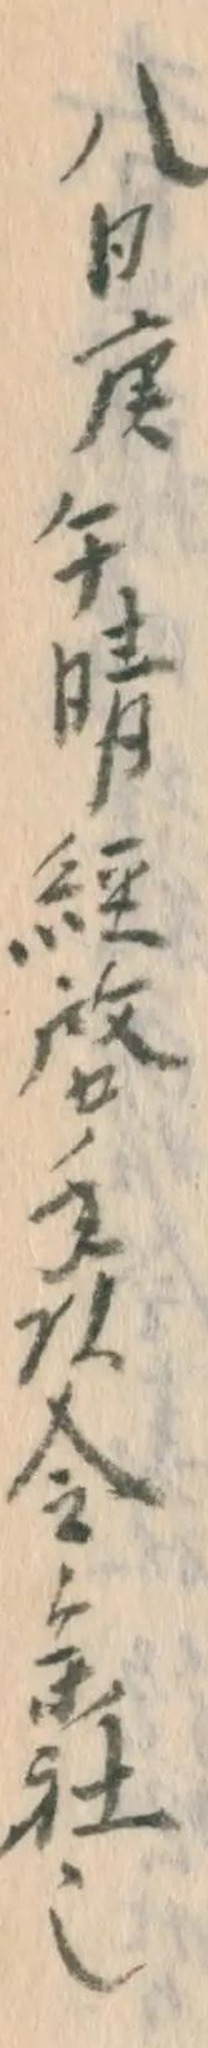八日庚午晴経啓年頭令参社也

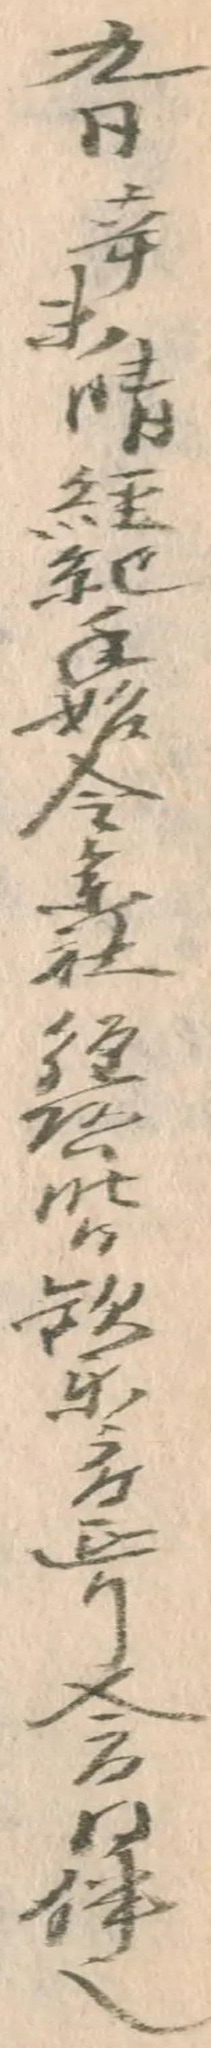九日辛未晴経紀年始令参社経啓昨日歓楽ニ付延引今日同伴也
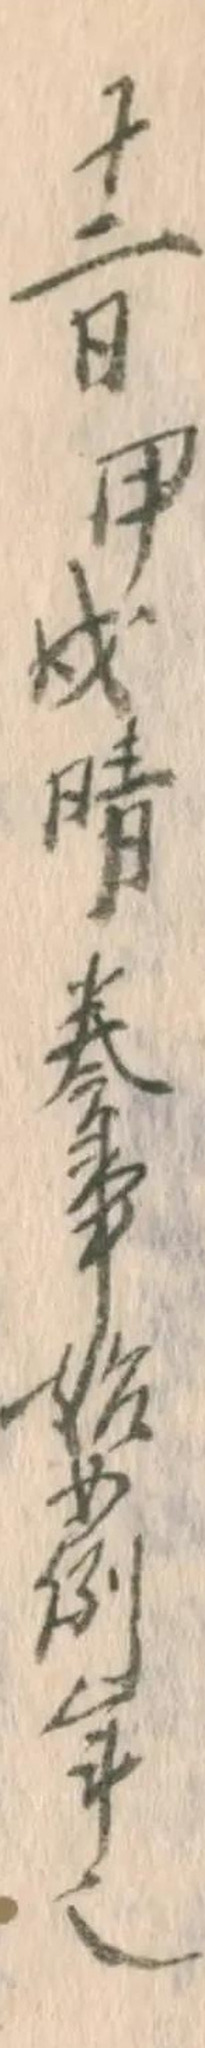十二日甲戌晴奏事始如例年也
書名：賀茂社記録. 第70冊
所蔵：国立国会図書館 National Diet Library, JAPAN
